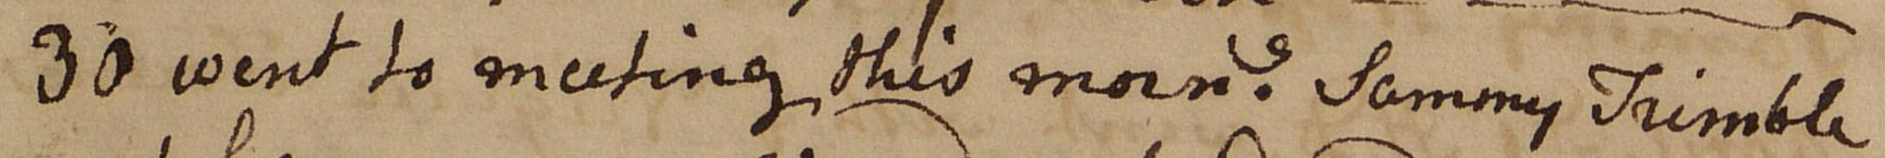30 went to meeting this morn^g. Sammy Trimble
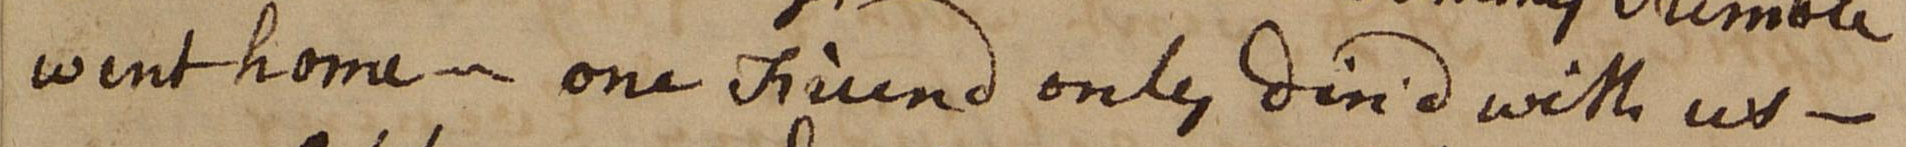went home- one Friend only din'd with us-
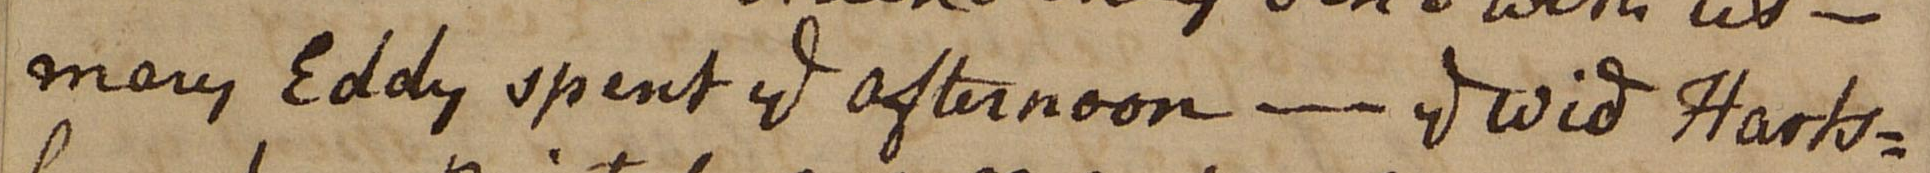mary Eddy spent y^e afternoon- y^e wid Harts-
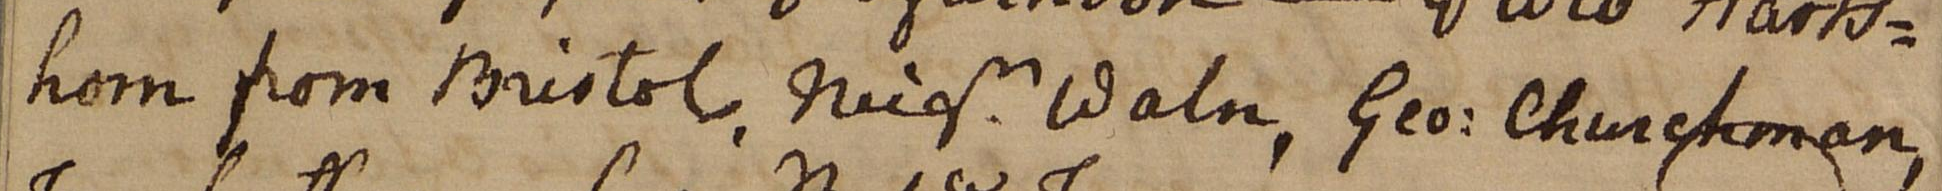hom from Bristol, Neig^r. Waln, Geo: Churchman,
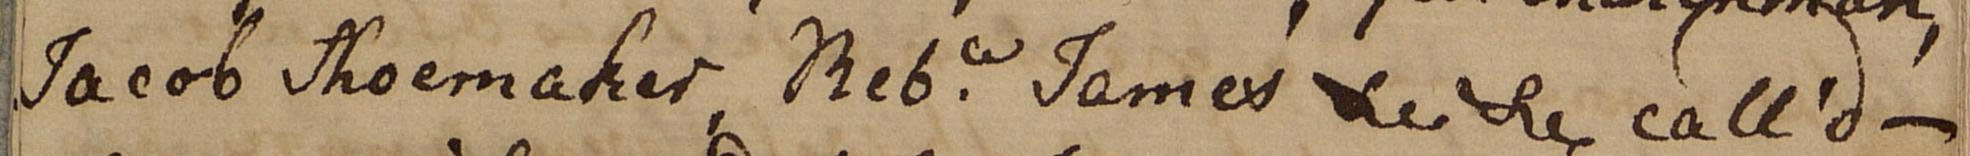Jacob Shoemaker Reb^a. James &c &c, call'd-
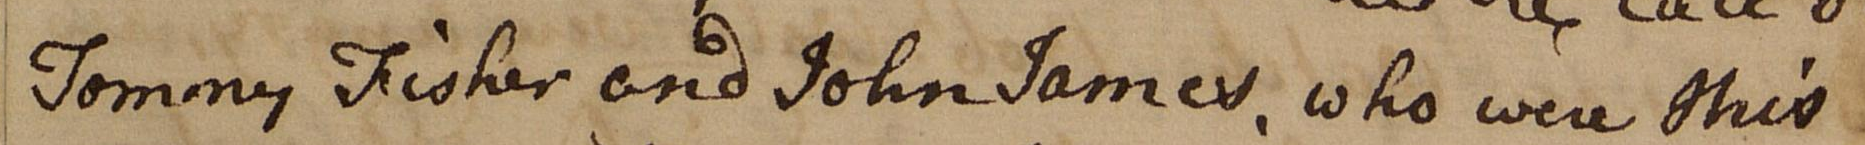Tommy Fisher and John James, who were this
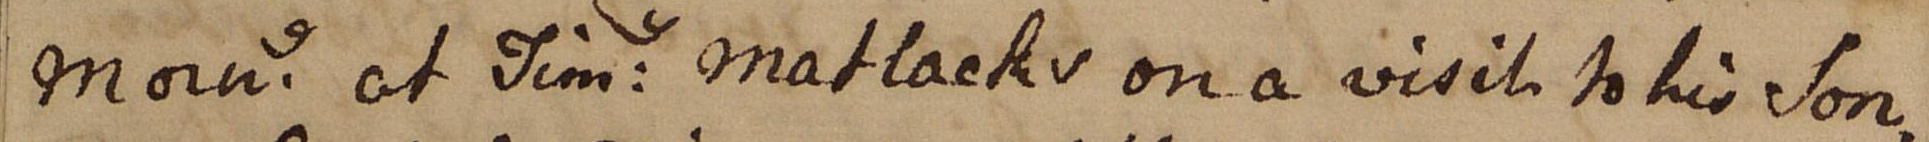morn^g. at Tim^y: Matlacks on a visit to his Son,
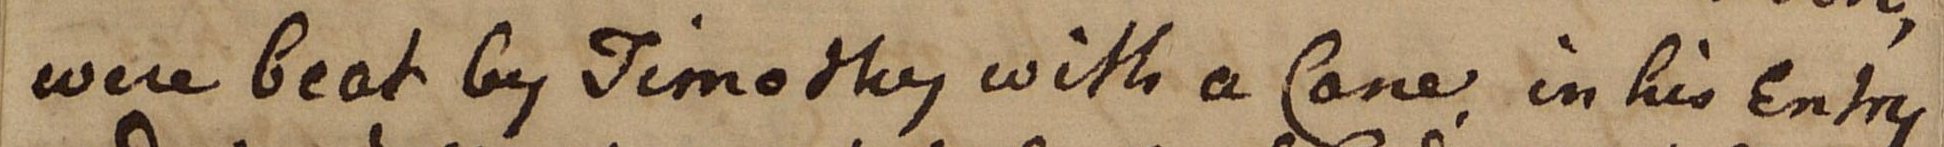were beat by Timothy with a Cane, in his Entry
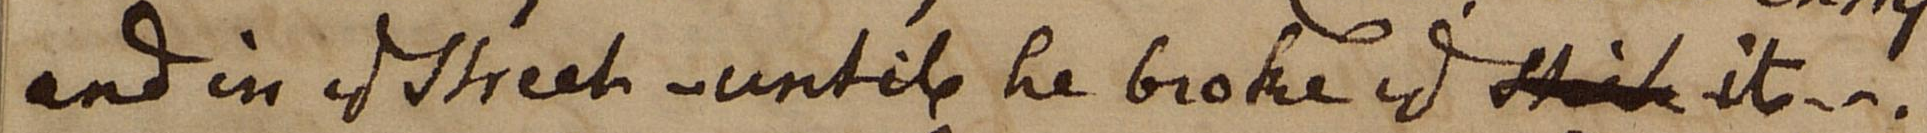and in y^e Street- until he broke y^e [stick] it-
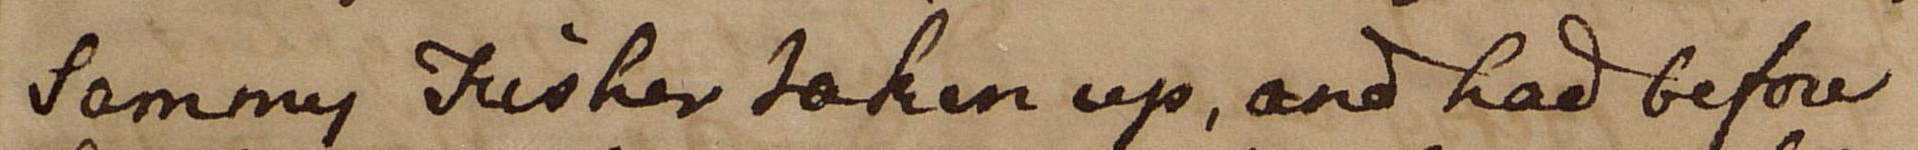Sammy Fisher taken up, and had before
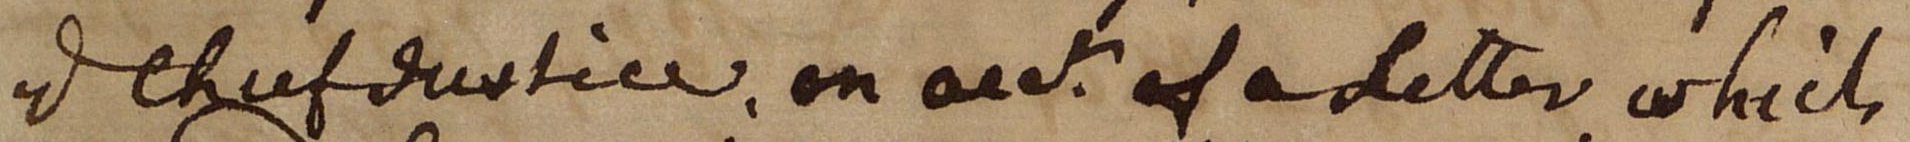y^e Chief Justice, on acc^t. of a Letter which
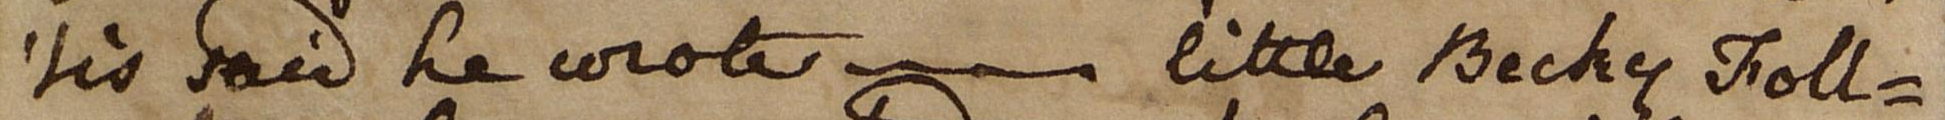'tis said he wrote- little Becky Foll-
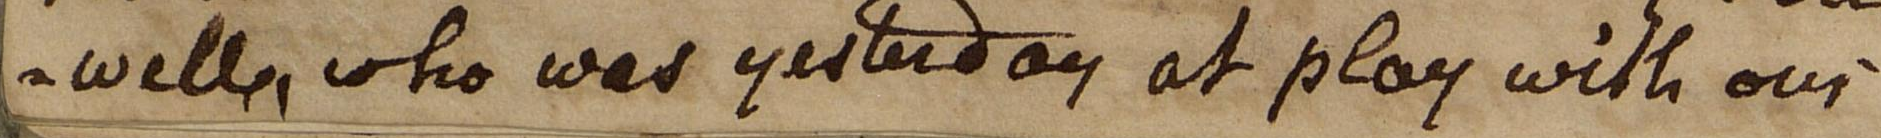-well, who was yesterday at play with our
